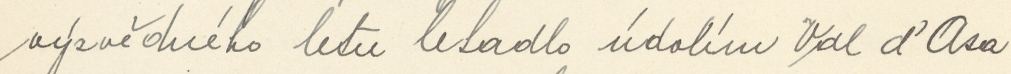výzvědného letu letadlo údolím Val d' Asa
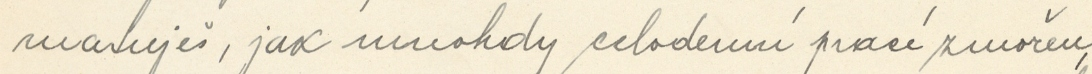matuješ, jak mnohdy celodenní prací zmořen,
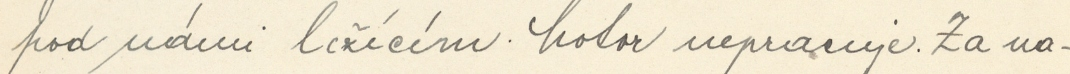pod námi ležícím. Motor nepracuje. Za na-
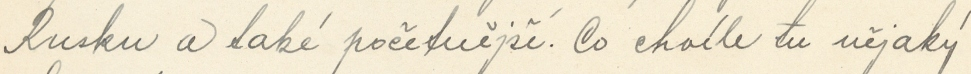Rusku a také početnější. Co chvíle tu nějaký
